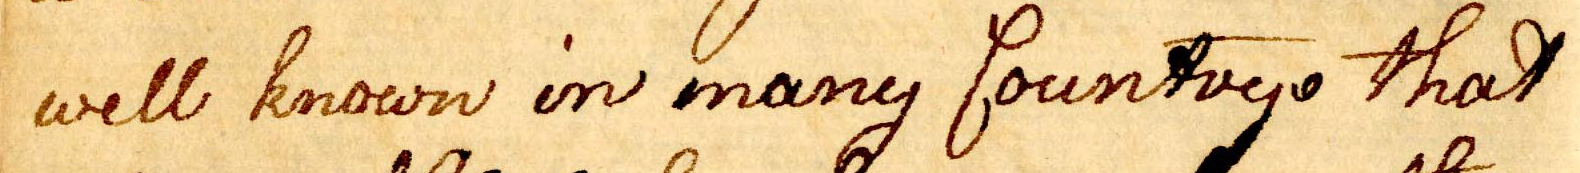well known in many Countrys that
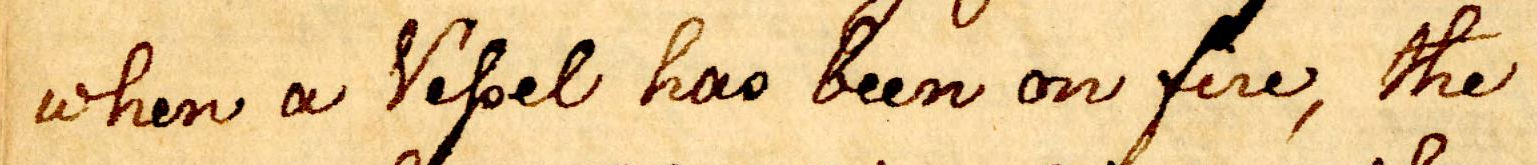when a Vessel has been on fire, the
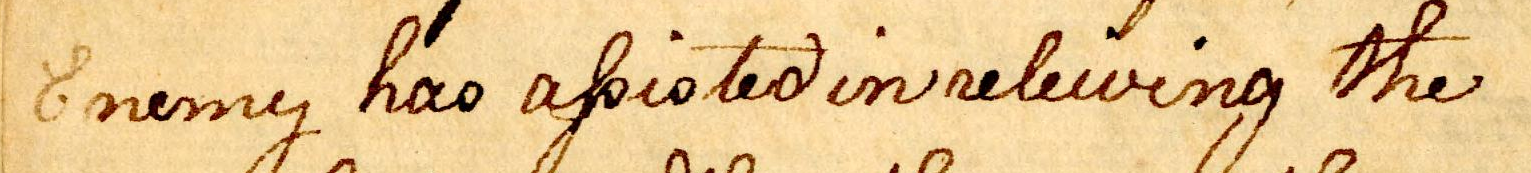Enemy has assisted in releiving the
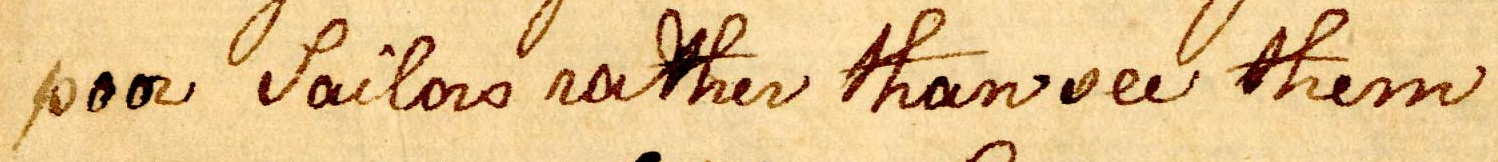poor Sailors rather than see them
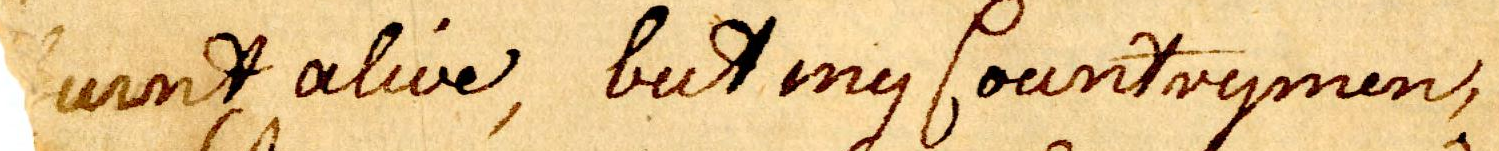burnt alive, but my Countrymen,
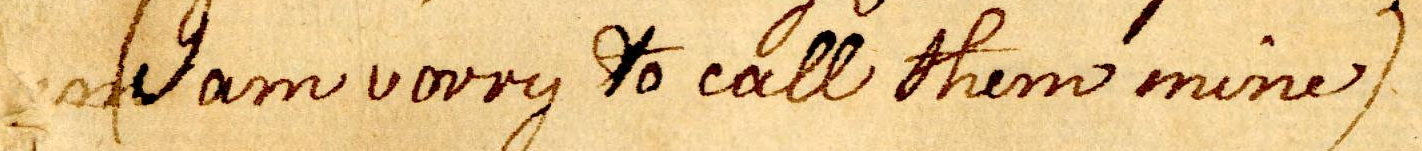(I am sorry to call them mine)
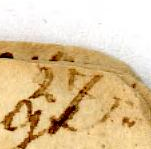27
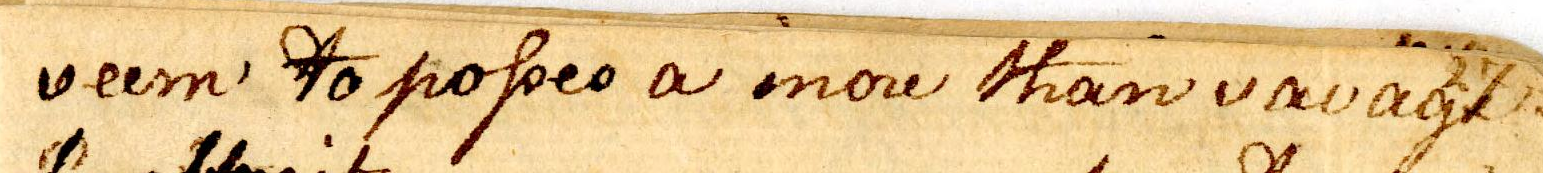seem to posses a more than savage
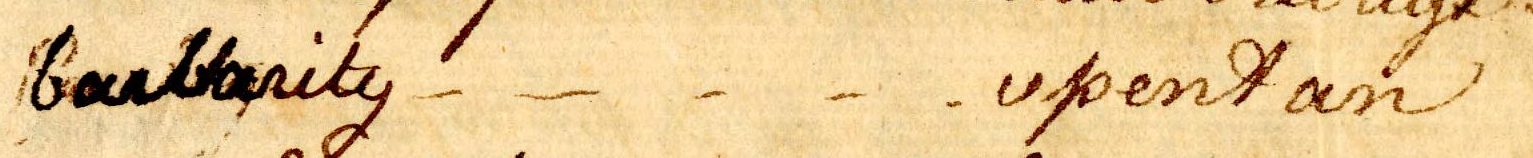barbarity---- spent an
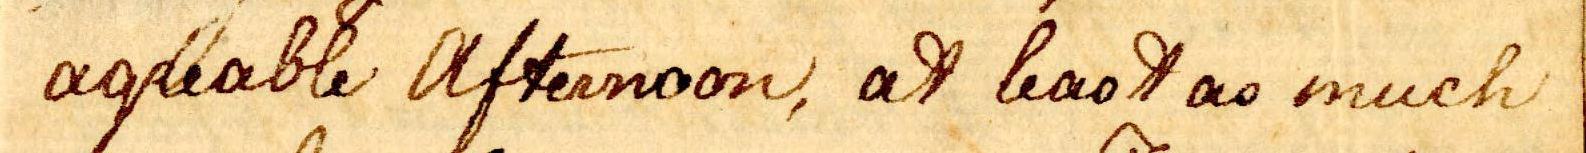agreable Afternoon, at least as much
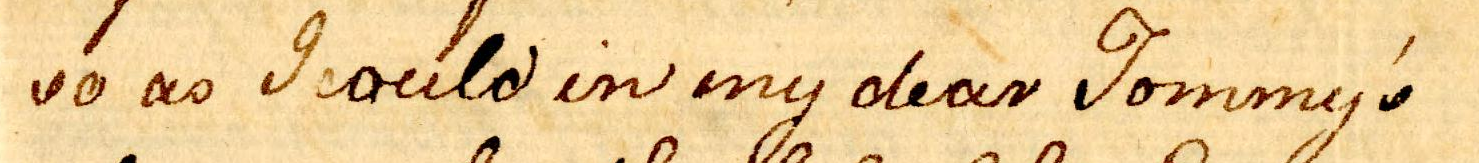so as I could in my dear Tommy's
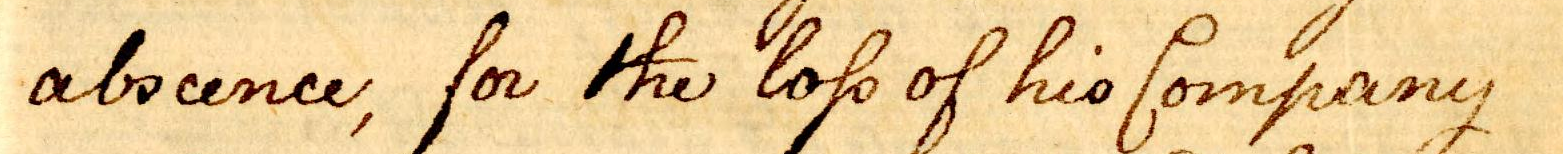abscence, for the loss of his Company
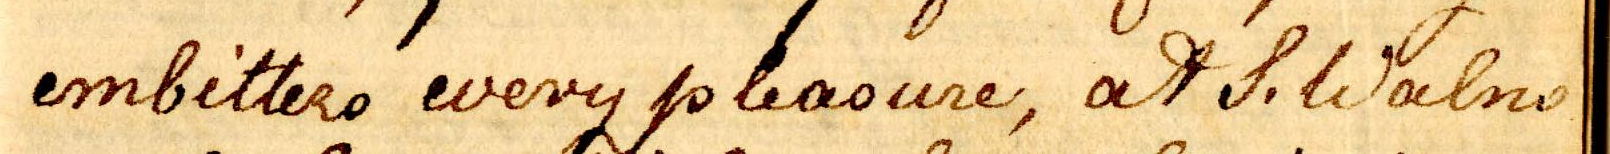embitters every pleasure, at S. Walns
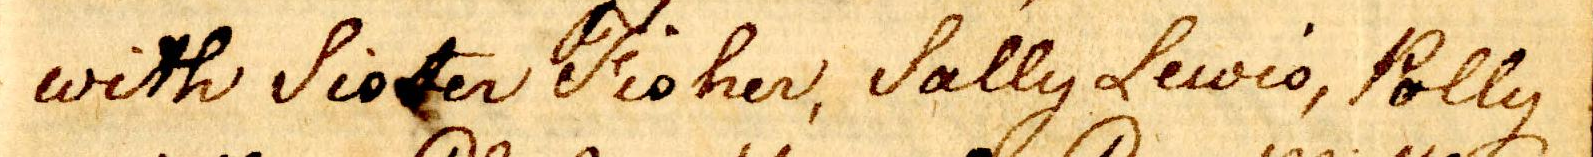with Sister Fisher, Sally Lewis, Polly
